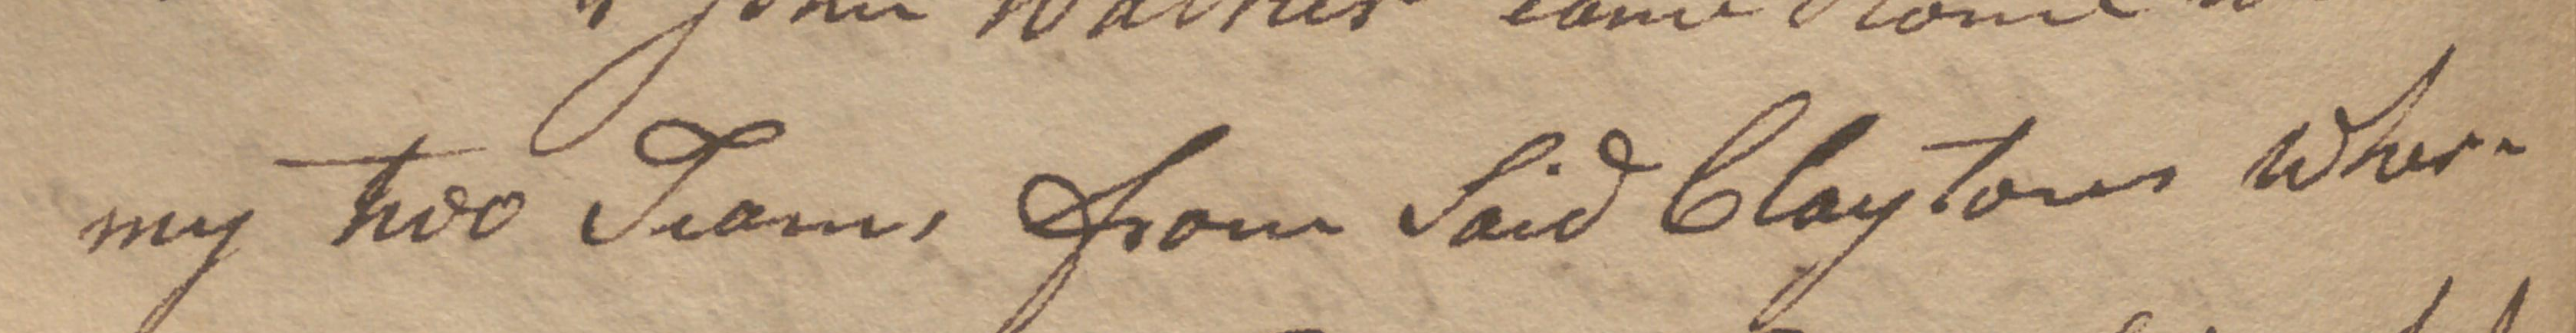my two Teams from Said Claytons wher
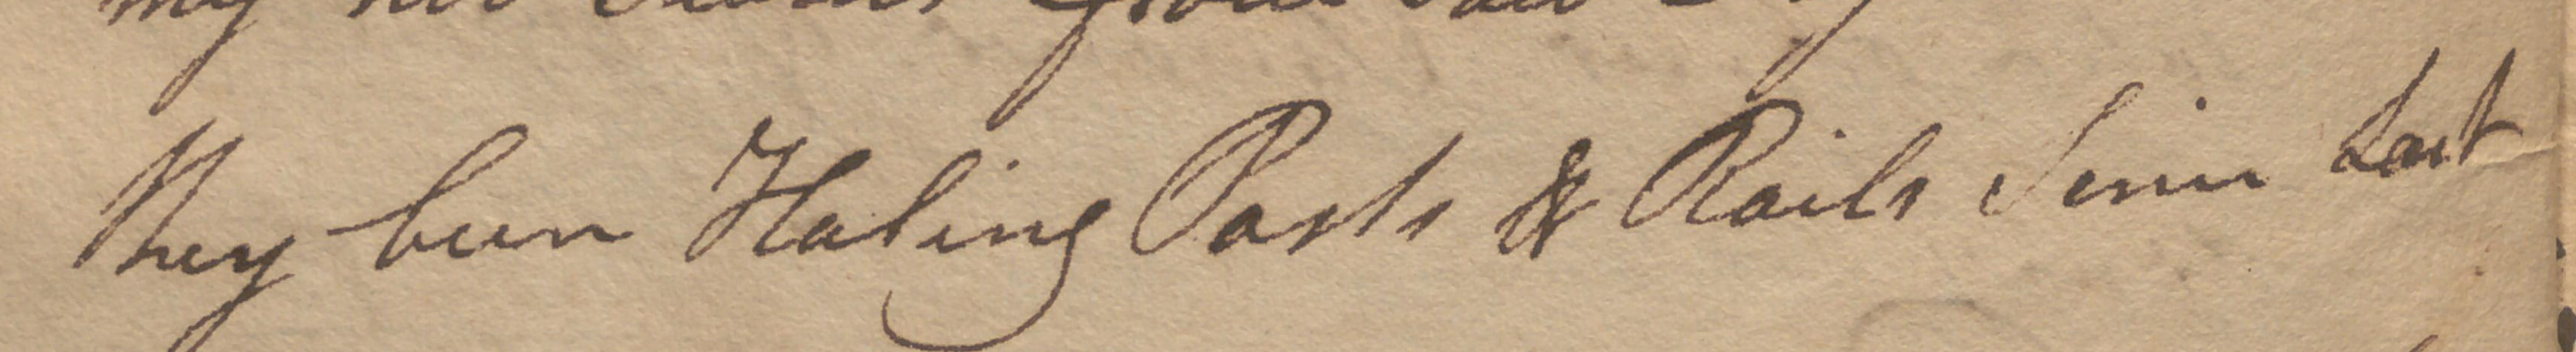they been Haling Posts & Rails since Last
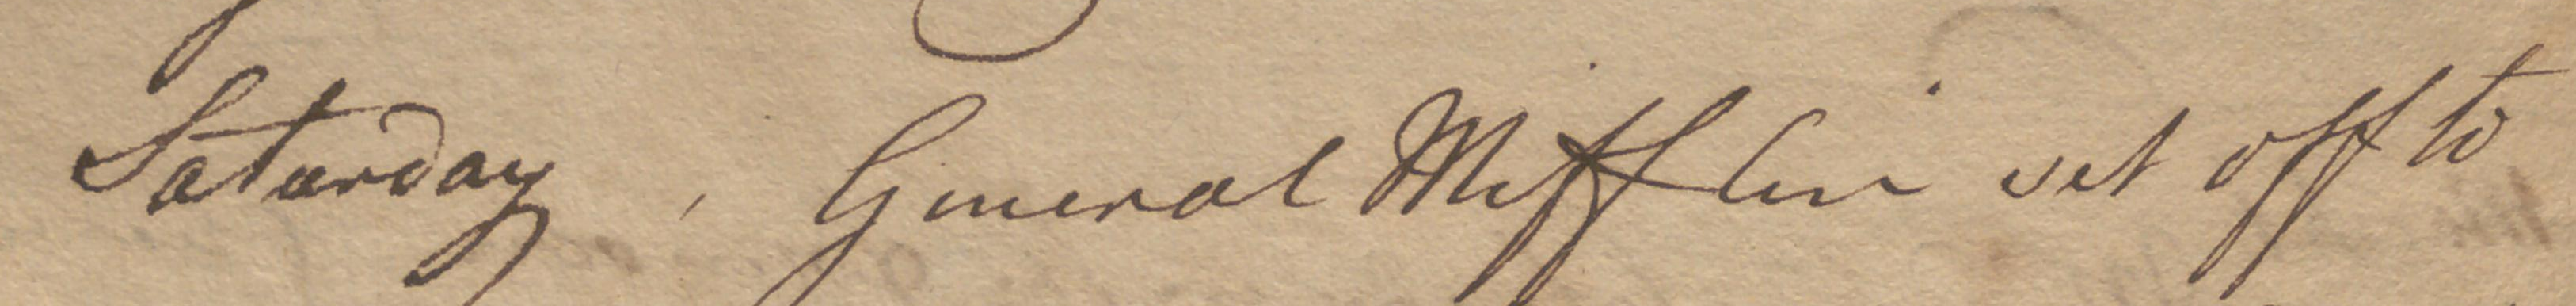Saturday. General Mifflin set off to
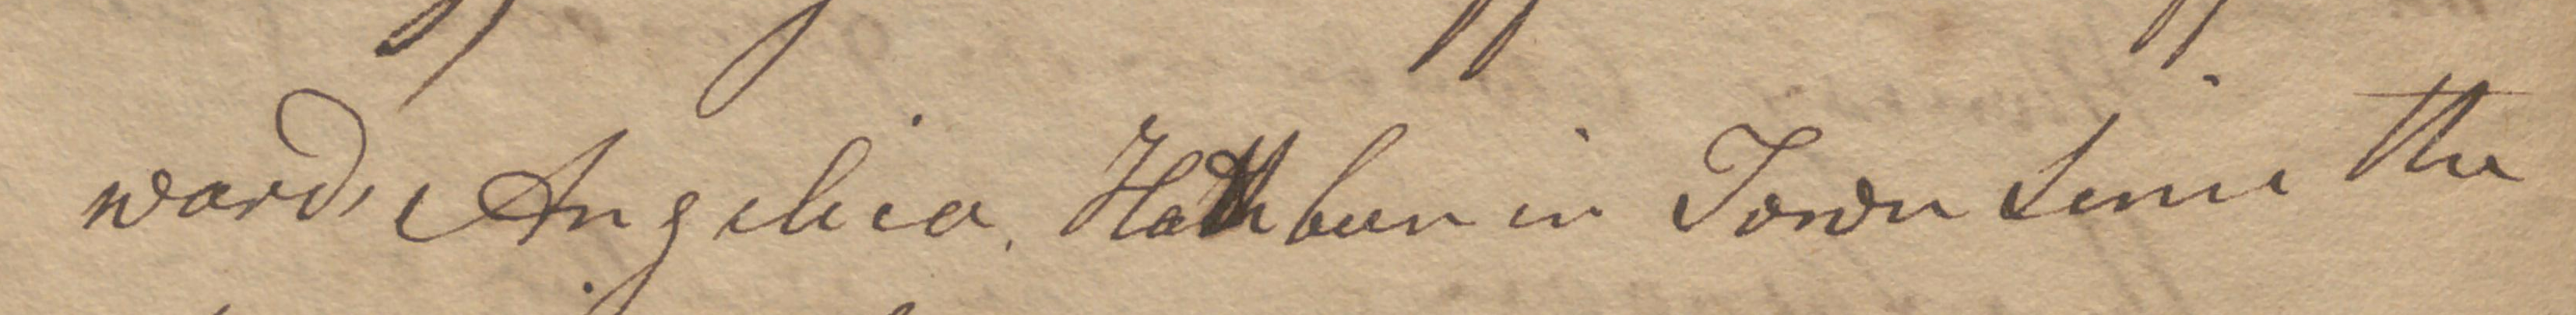wards Angelica Hathbun in Town since the
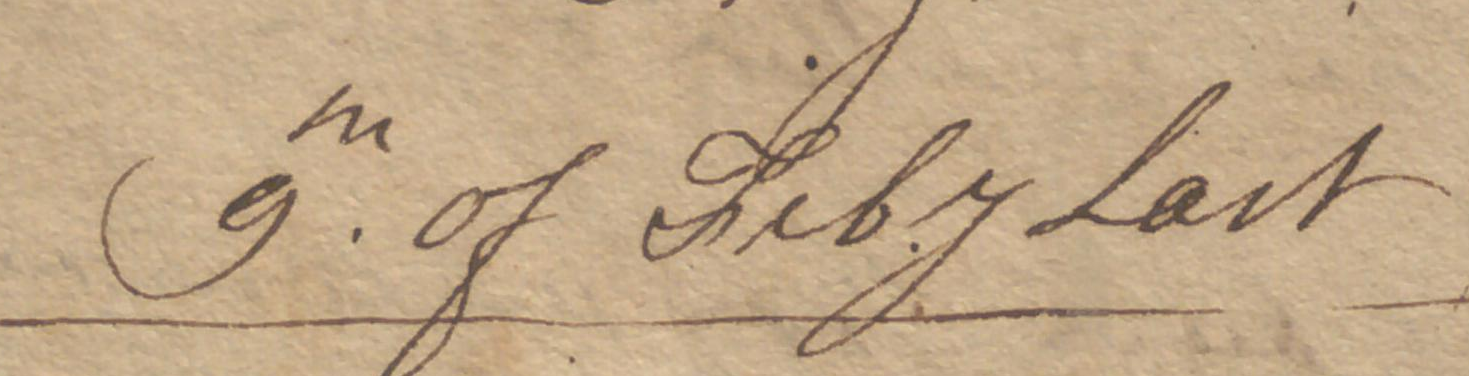9^th. of Feb^y. Last
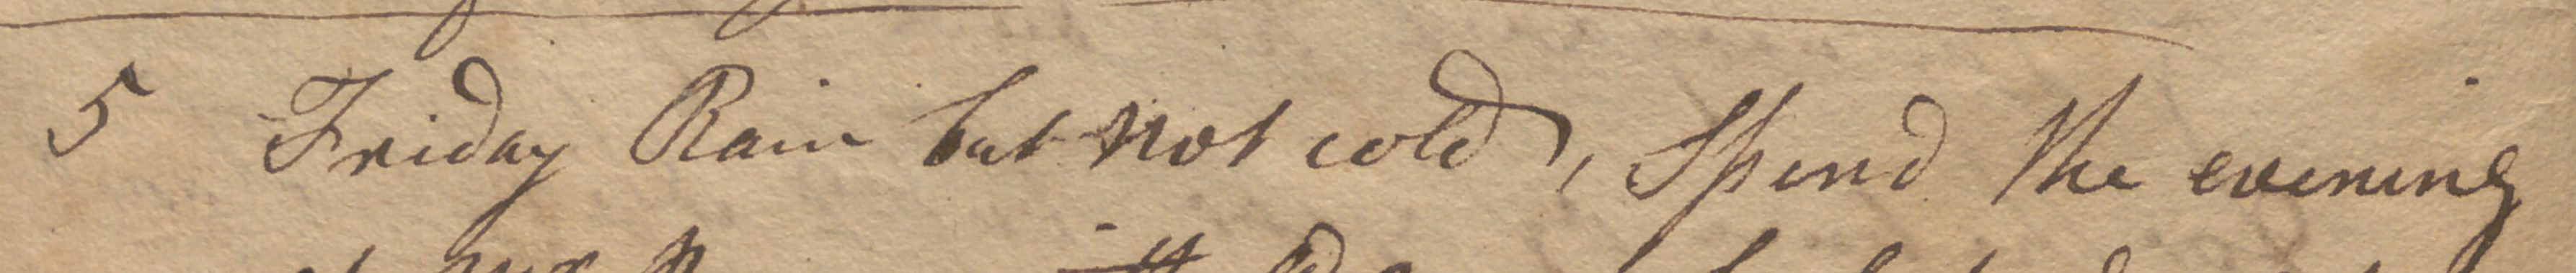5 Friday Rain but not cold, spend the evening
